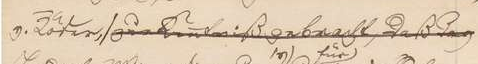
v. Röder, zur Kenntniß gebracht, daß das
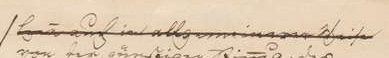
wenn auch in allgemeiner Weise
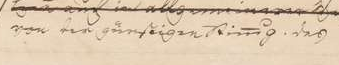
von der günstigen Stimmg. des
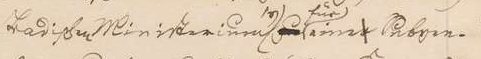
Badischen Ministeriumszufür einer Subven-
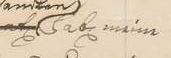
Gesandten haben meine
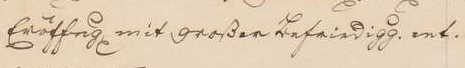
Eröffnungen mit großer Befriedigg. ent-
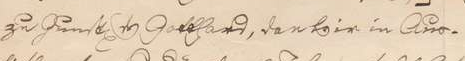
zu Gunsten ds Gotthard, den wir in Aus-
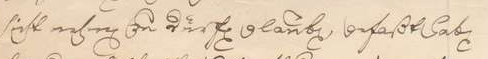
sicht nehmen zu dürfen glauben, gefaßt haben
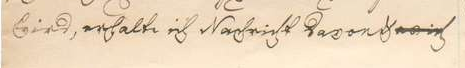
wird, erhalte ich Nachricht davon & es ich
